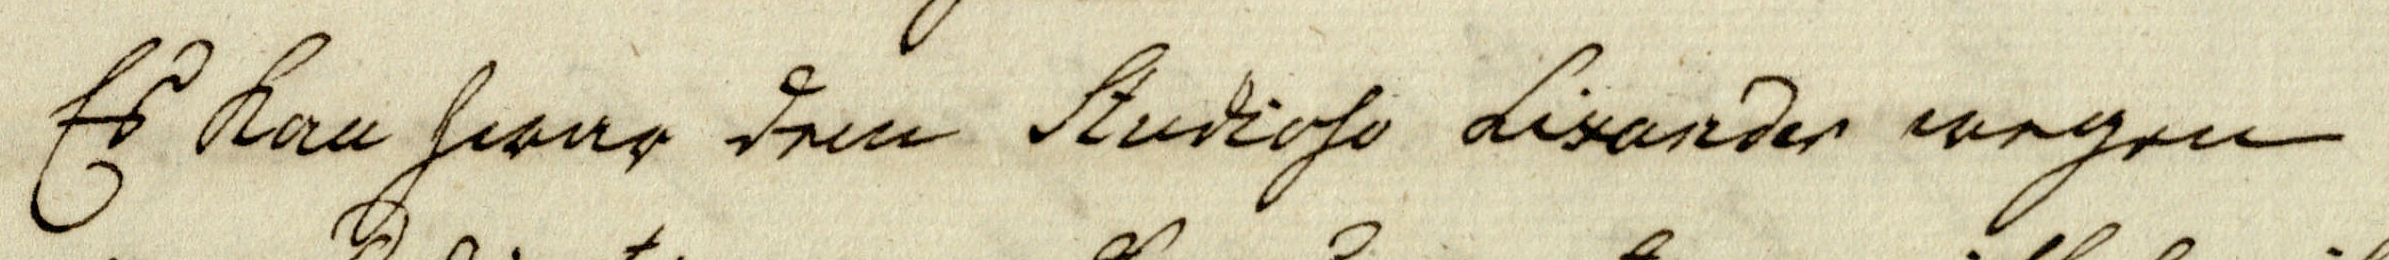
Es kan zwar dem Studioso Likander wegen
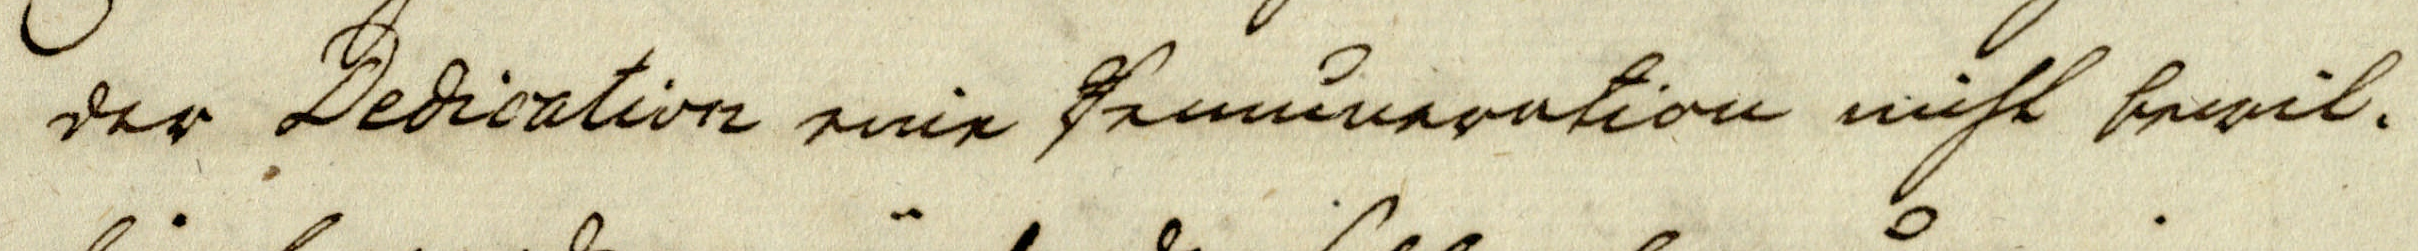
der Dedication eine Remuneration nicht bewil¬
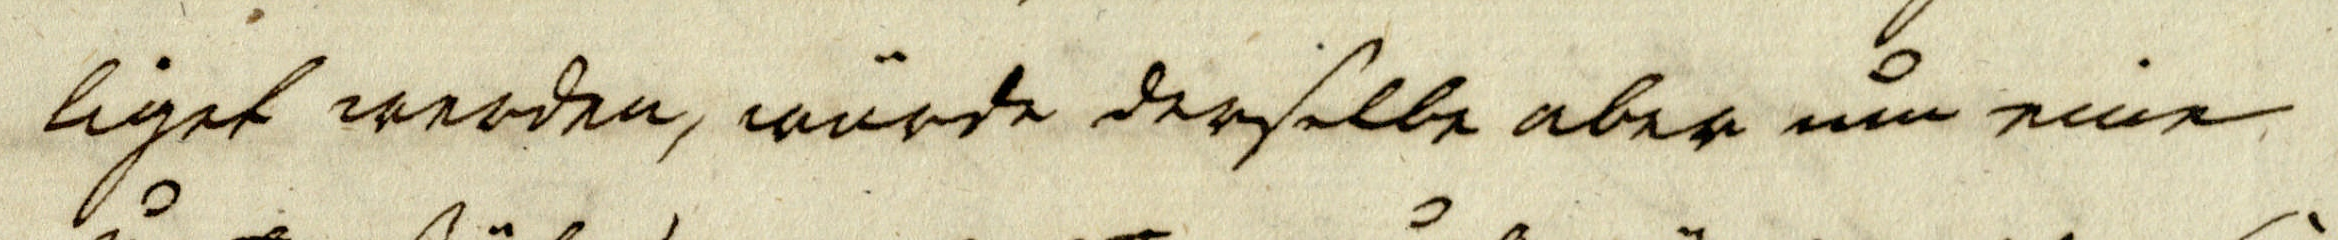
liget werden, würde derselbe aber um eine
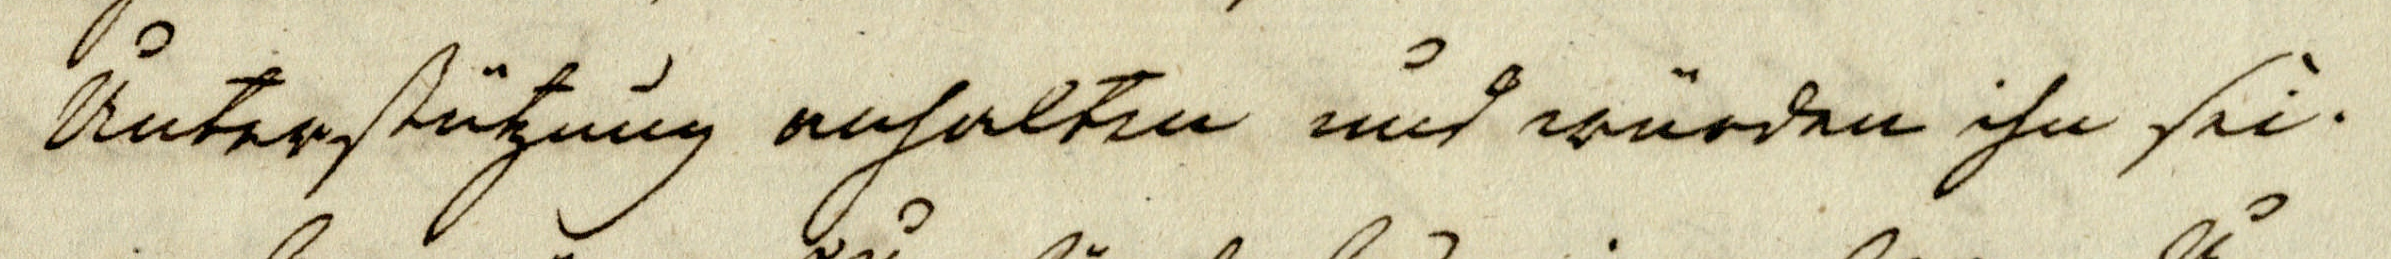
Unterstützung anhalten und würden ihn sei¬
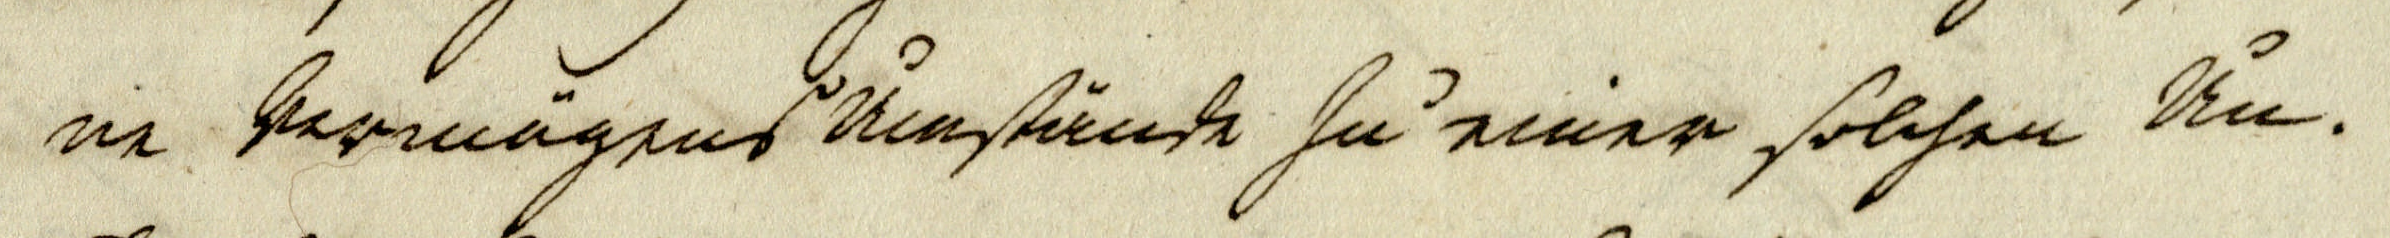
ne Vermögens Umstände zu einer solchen Un¬
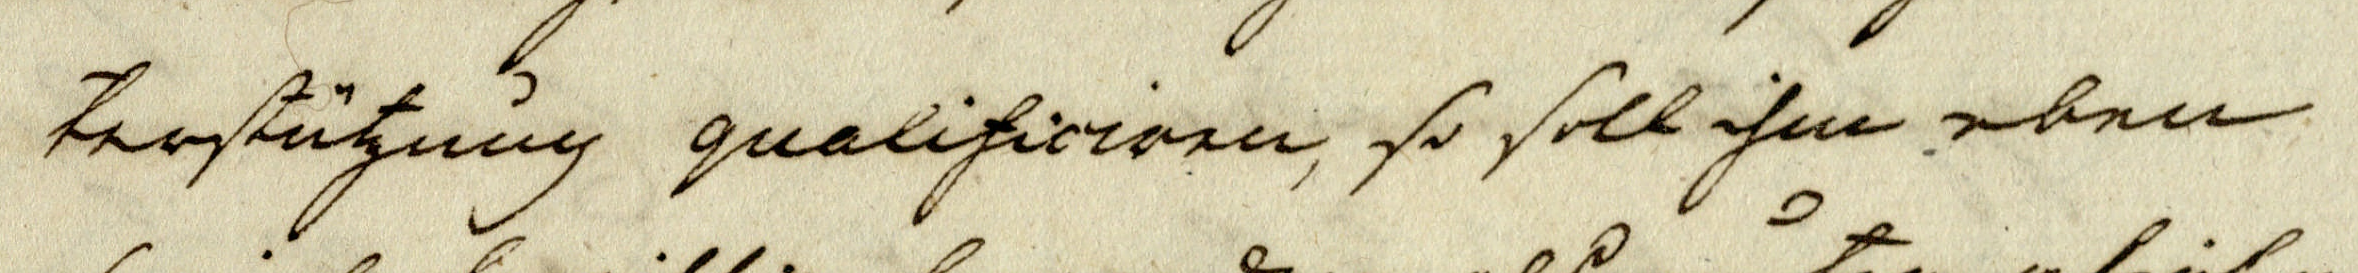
terstützung qualificiren, so soll ihm eben
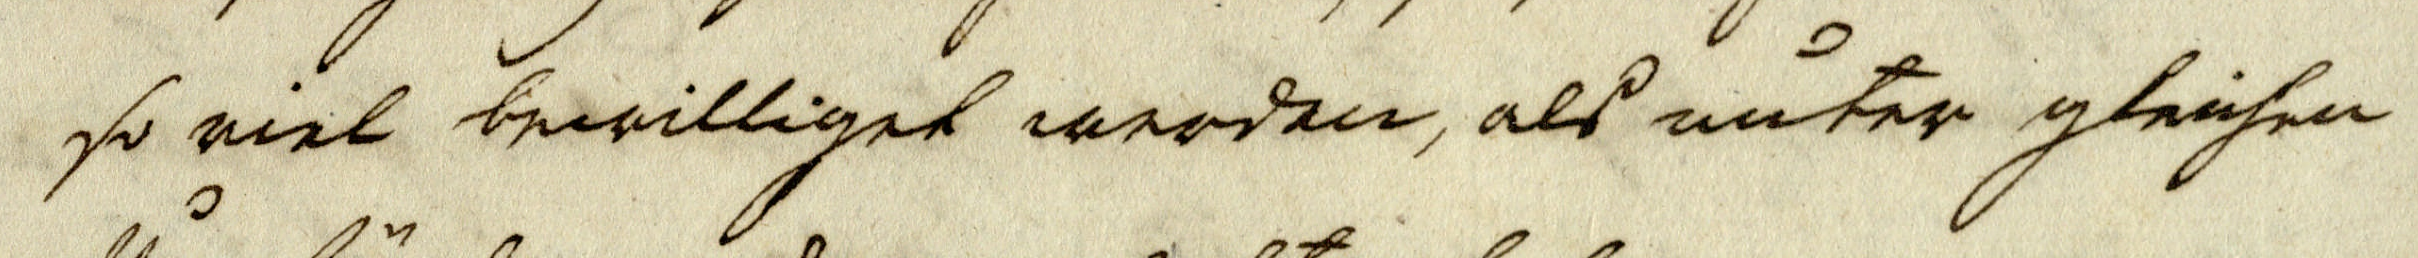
so viel bewilligt werden, als unter gleichen
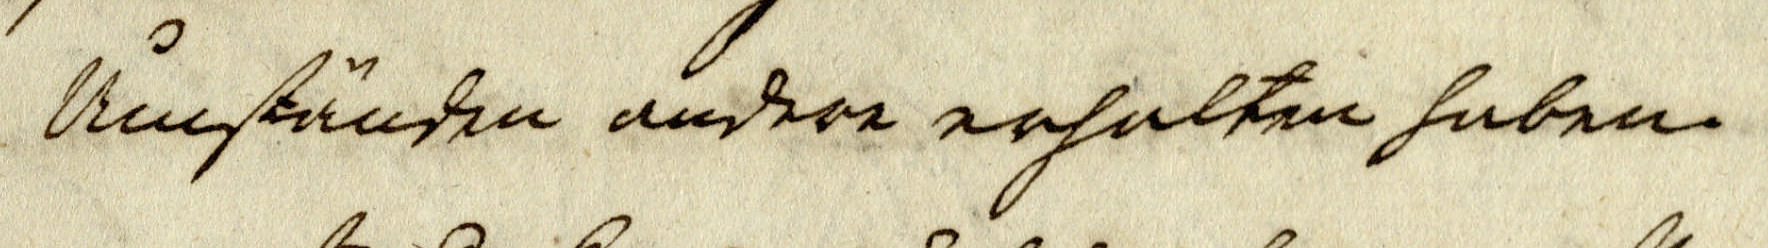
Umständen andere erhalten haben.
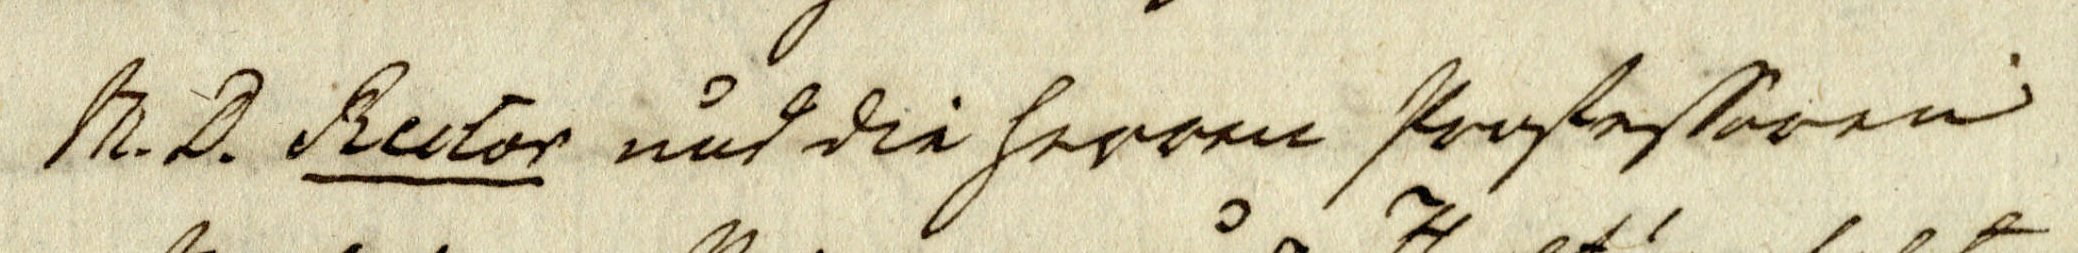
M. D. Rector und die Herren Professoren
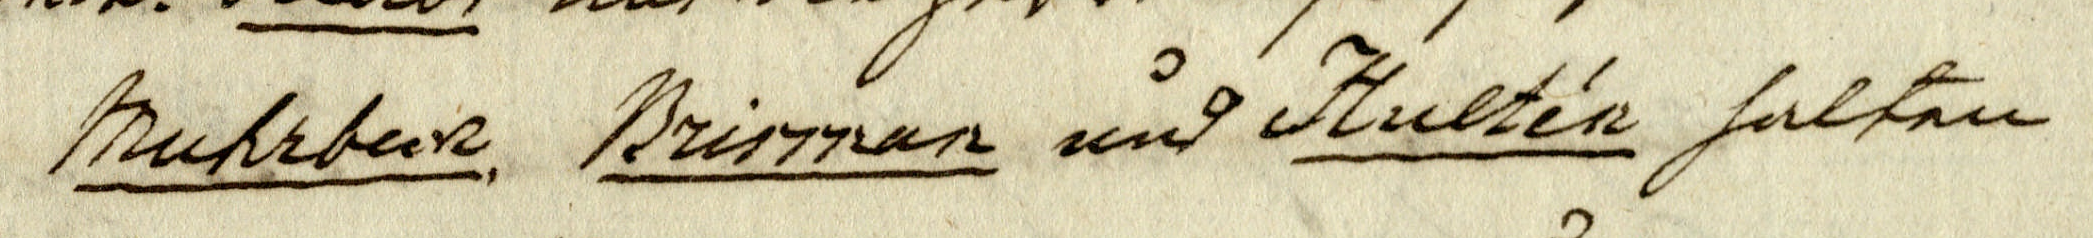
Muhrbeck. Brisman und Hultén halten
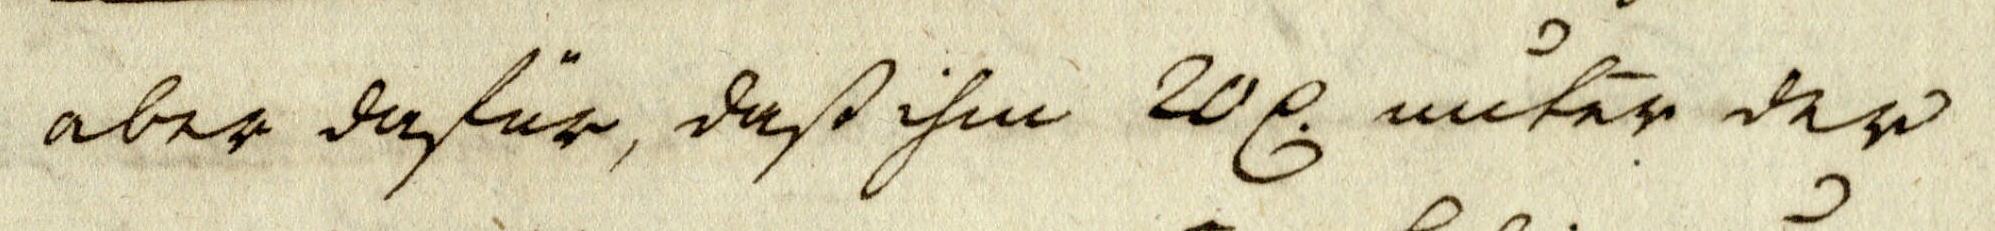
aber dafür, daß ihm 20 l. unter der
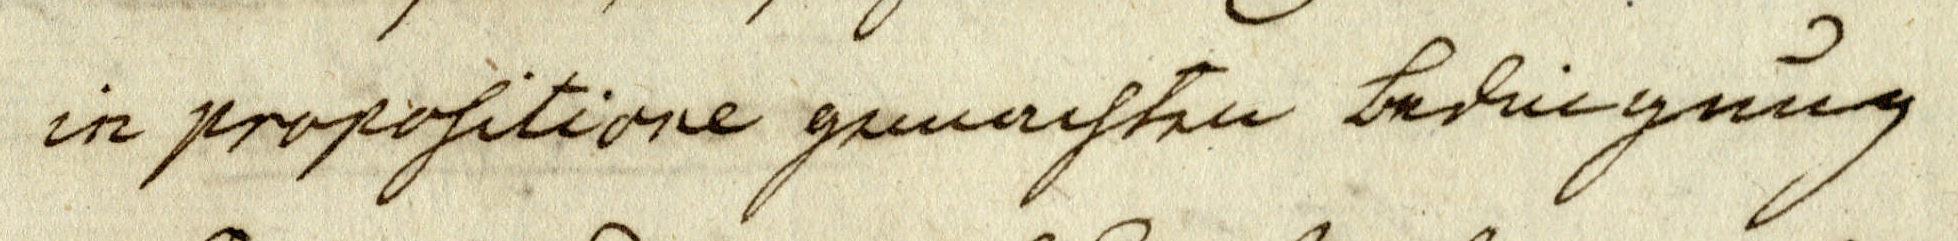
in propositione gemachten Bedingung
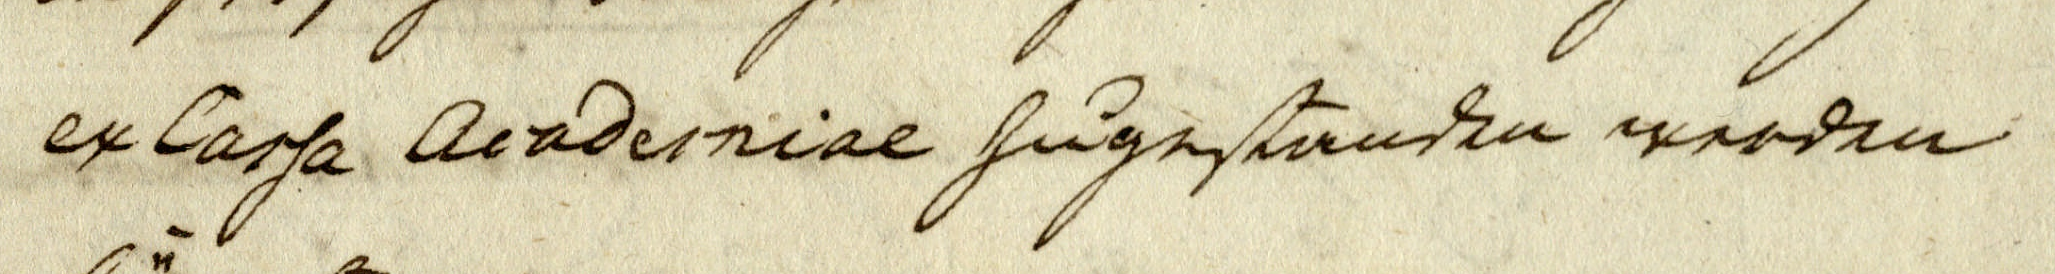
ex Cassa Academiae zugestanden werden
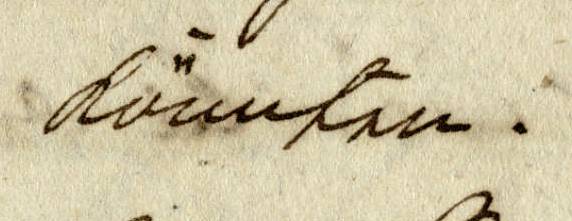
könnten.
